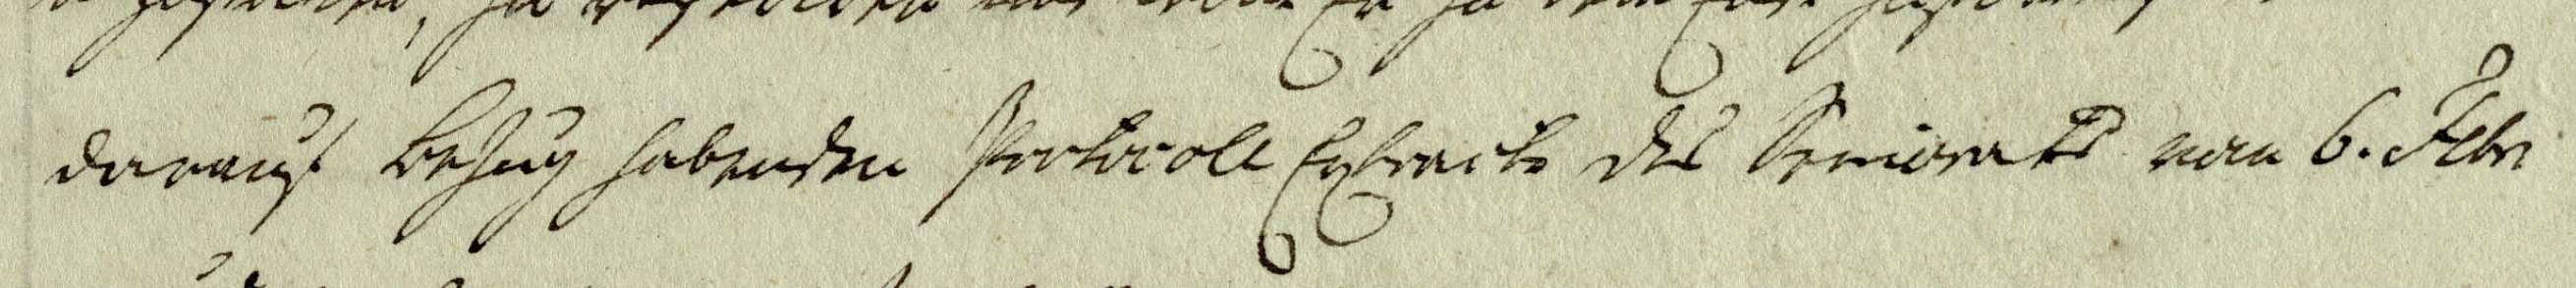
darauf Bezug habenden Protocoll Extracte des Seniorats vom 6. Febr.
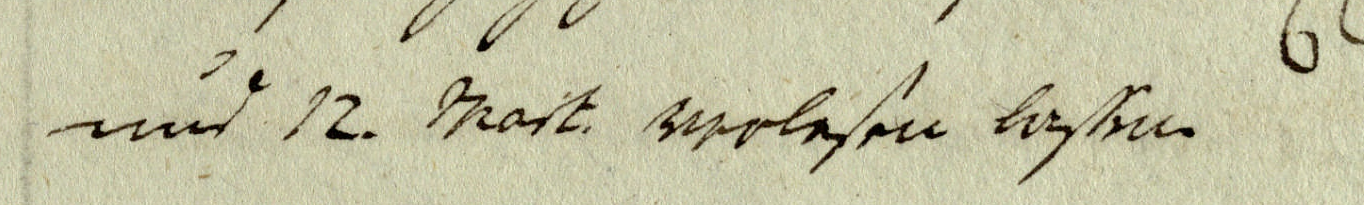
und 12. Mart. verlesen lassen.
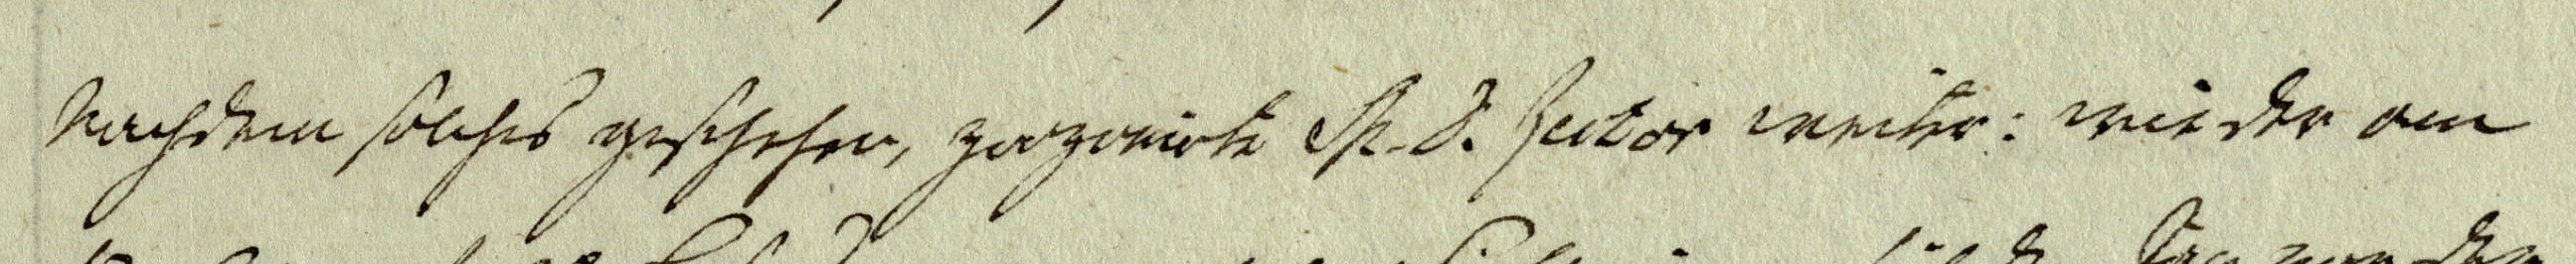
Nachdem solches geschehen, proponirte M. D. Rector weiter: wie der am
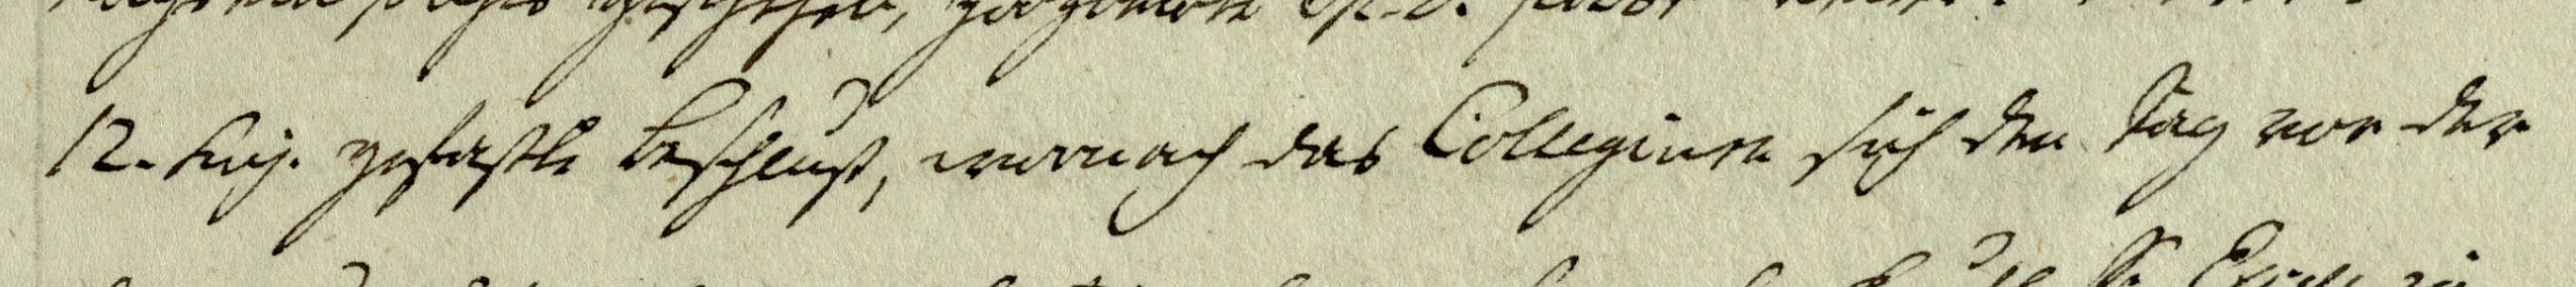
12. huj. gefaßte Beschluß, wornach das Collegium sich den Tag vor der
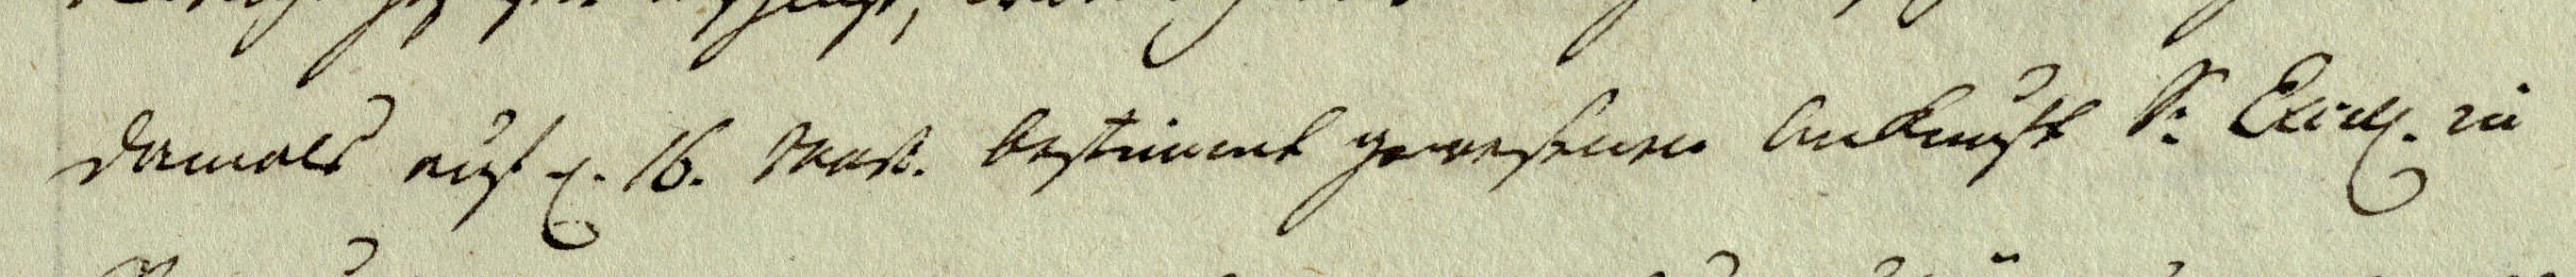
damals auf d. 16. Mart. bestimmt gewesenen Ankunft Sr. Excel. in
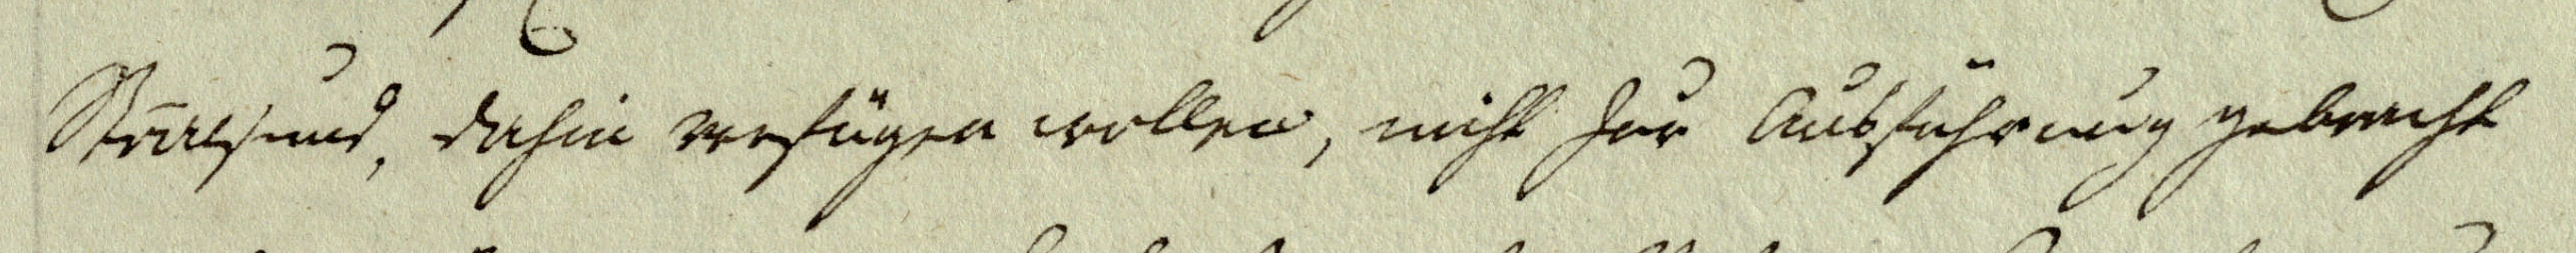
Stralsund, dahin verfügen wollen, nicht zur Ausführung gebracht
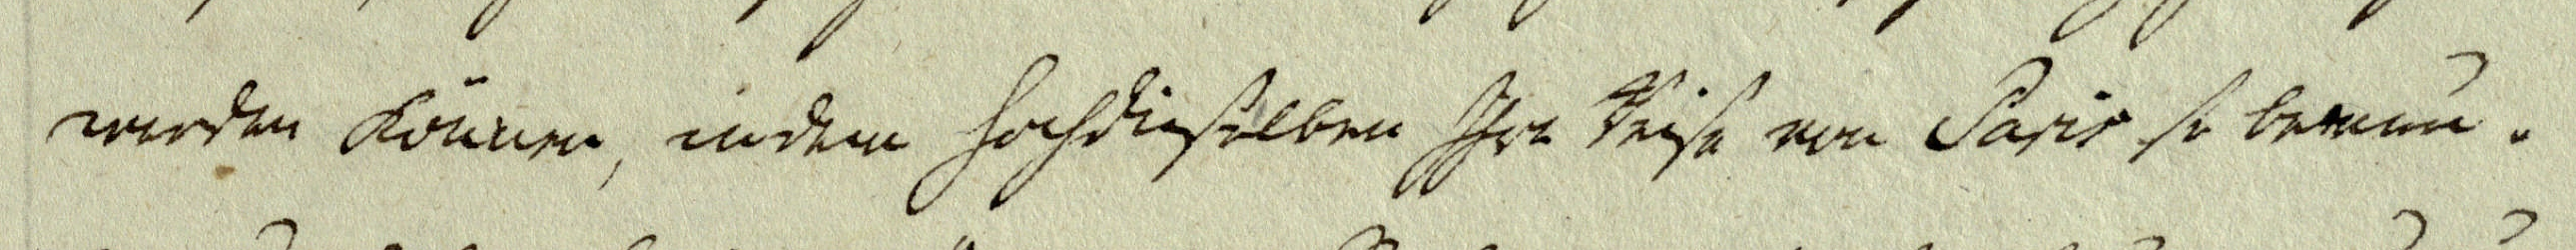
werden können, indem Hochdieselben Ihre Reise von Paris so bewun¬
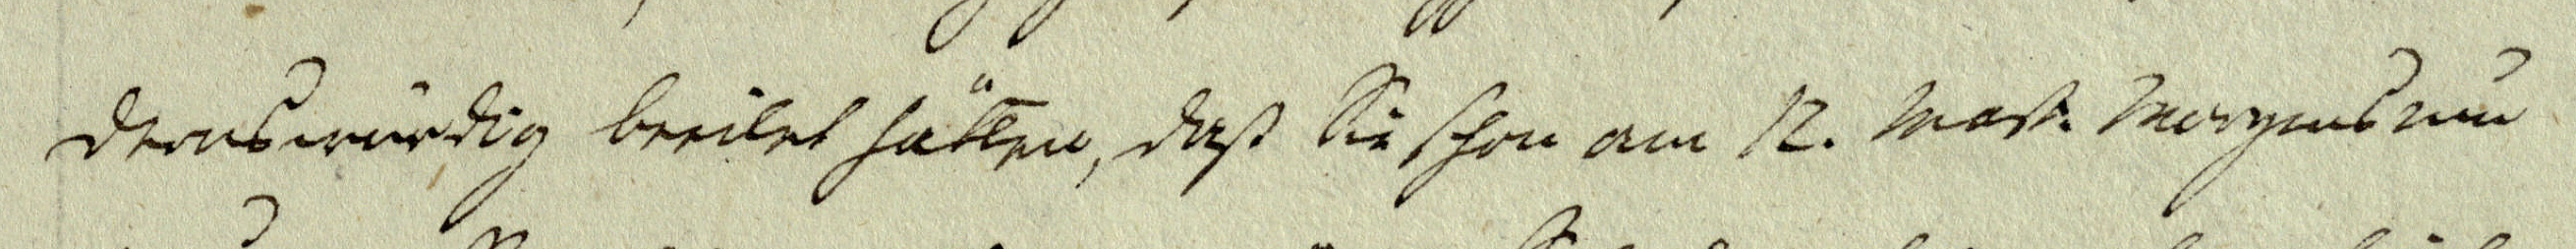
dernswürdig beeilet hätten, daß Sie schon am 12. Mart. Morgens um
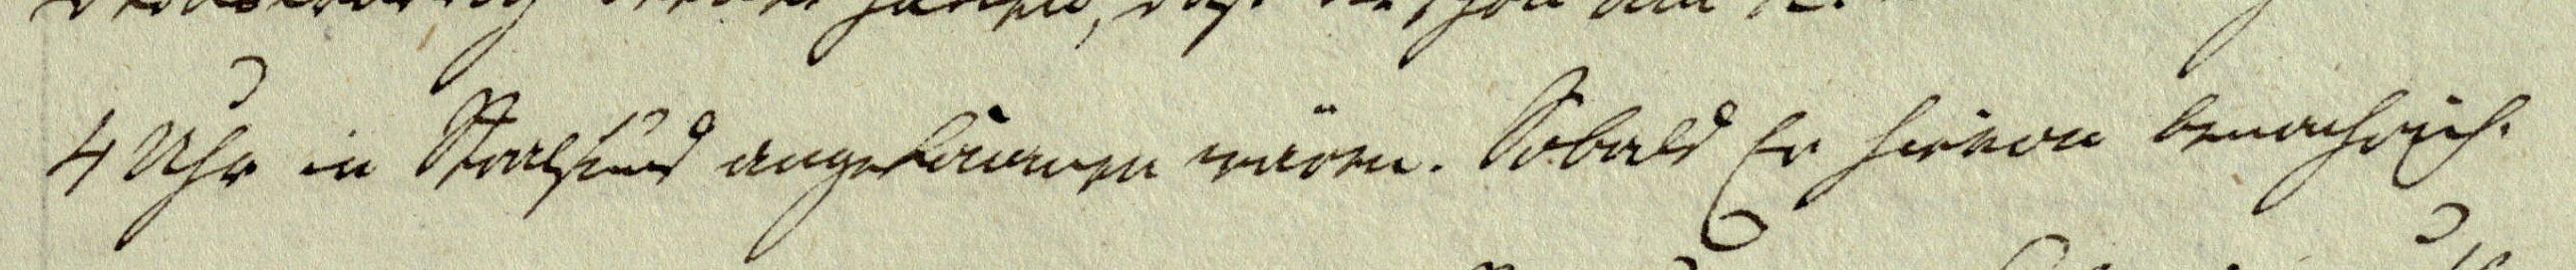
4 Uhr in Stralsund angekommen wären. Sobald Er hievon benachrich¬
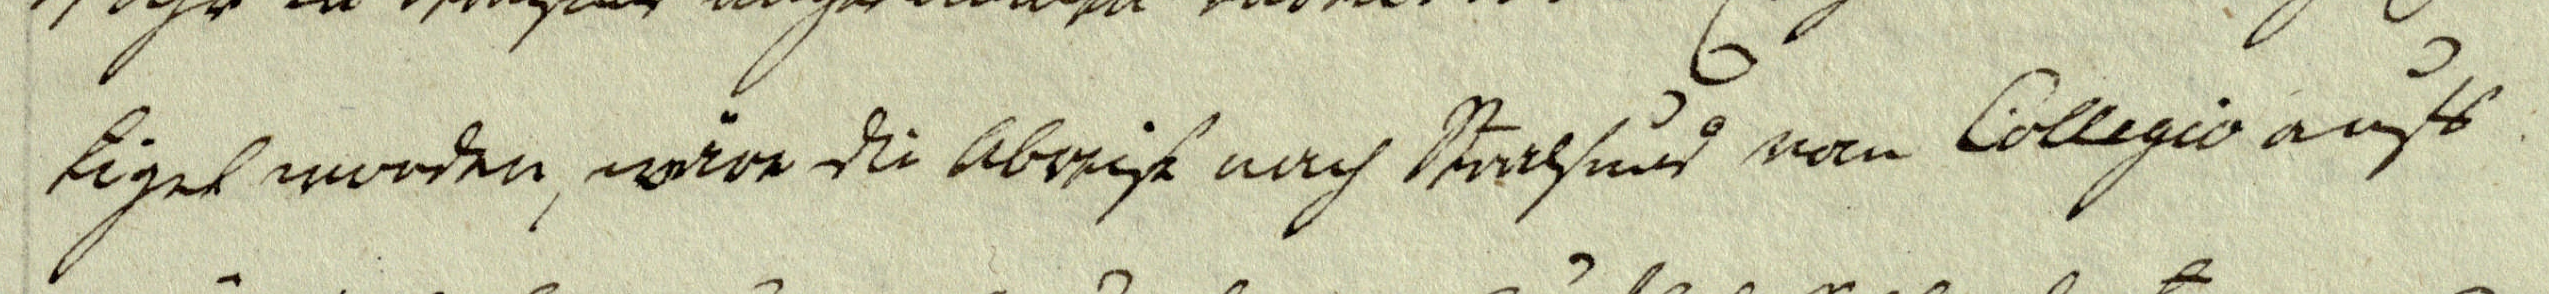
tiget worden, wäre die Abreise nach Stralsund vom Collegio aufs
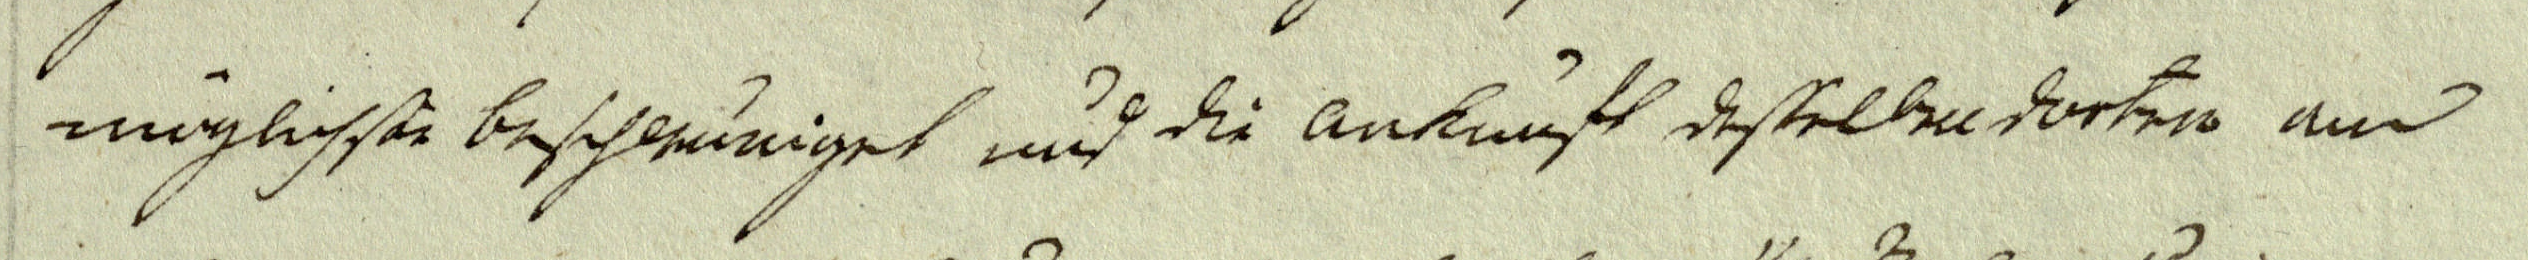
möglichste beschleuniget und die Ankunft desselben dorten am
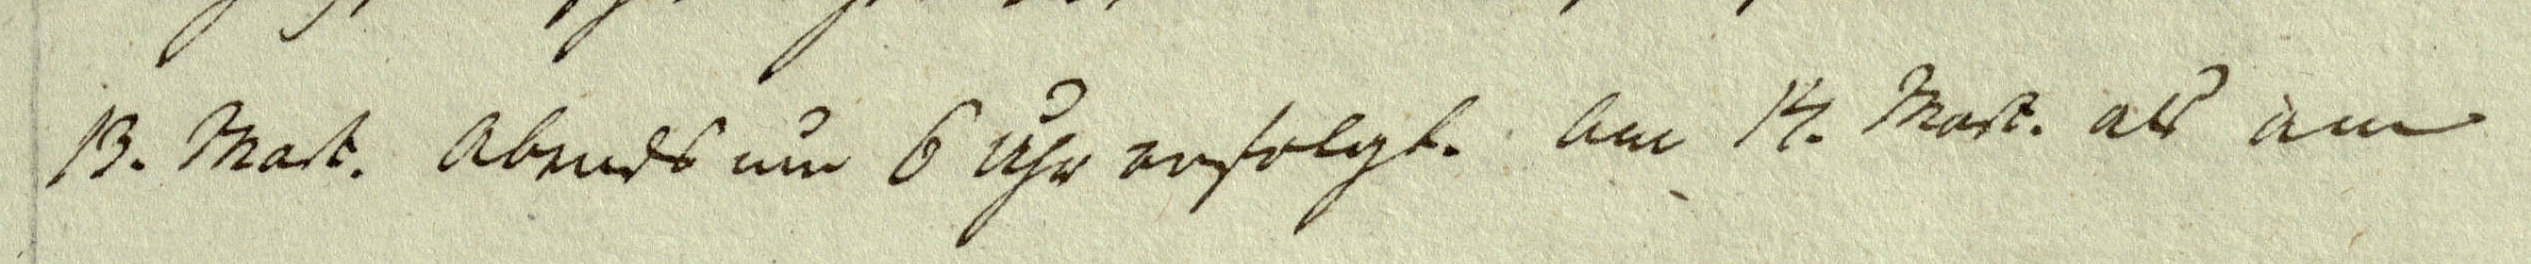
13. Mart. Abends um 6 Uhr erfolgt. Am 14. Mart. als am
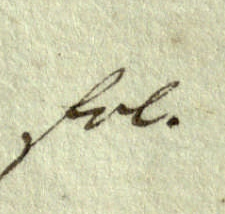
fol¬
